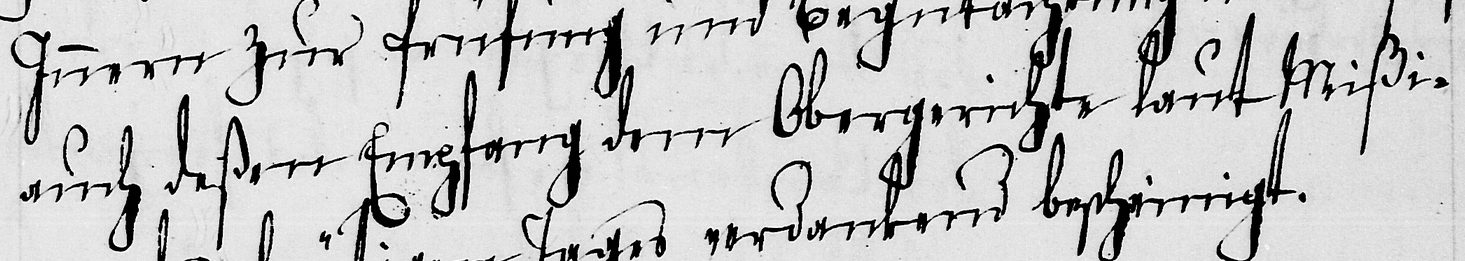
auch deßen Empfang dem Obergerichte laut Mißi¬
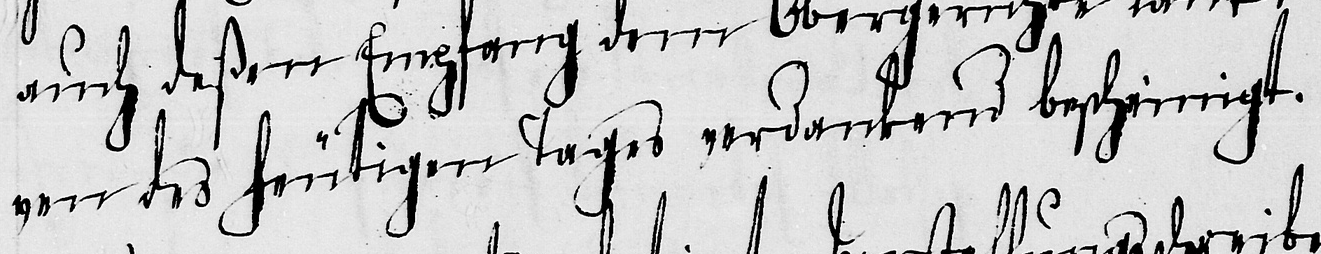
ven des heutigen Tages verdankend bescheinigt.
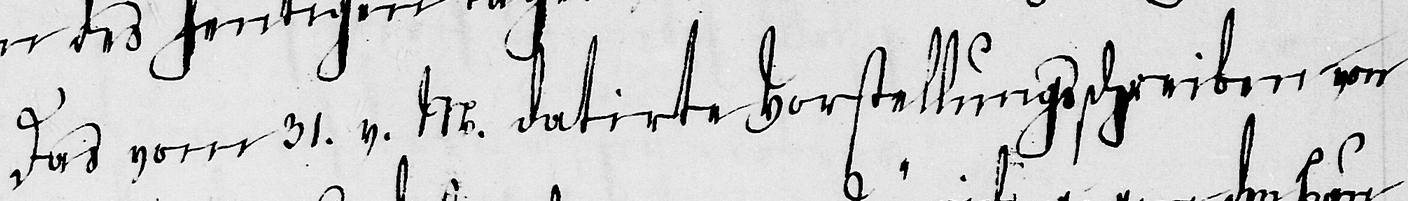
Das vom 31. v. M. datirte Vorstellungsschreiben von
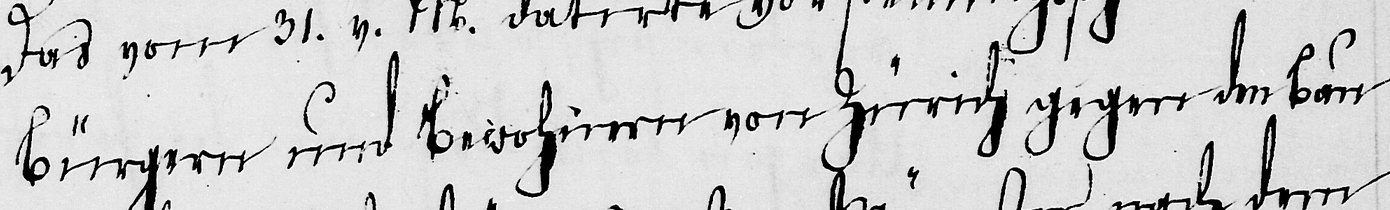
Bürgern und Bewohnern von Zürich gegen den Bau
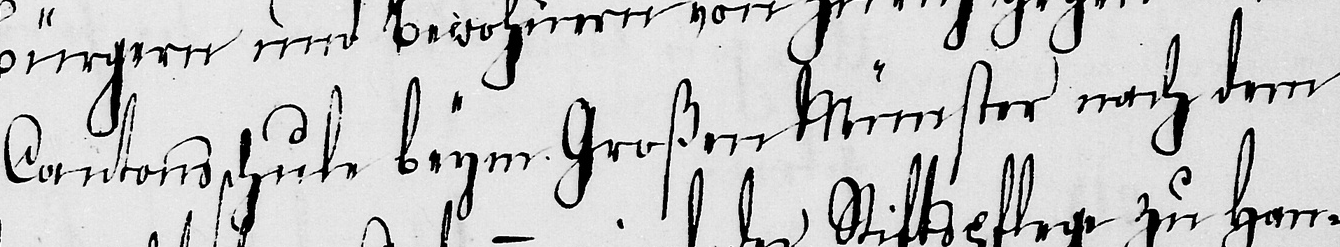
Cantonsschule beym Großen Münster nach dem
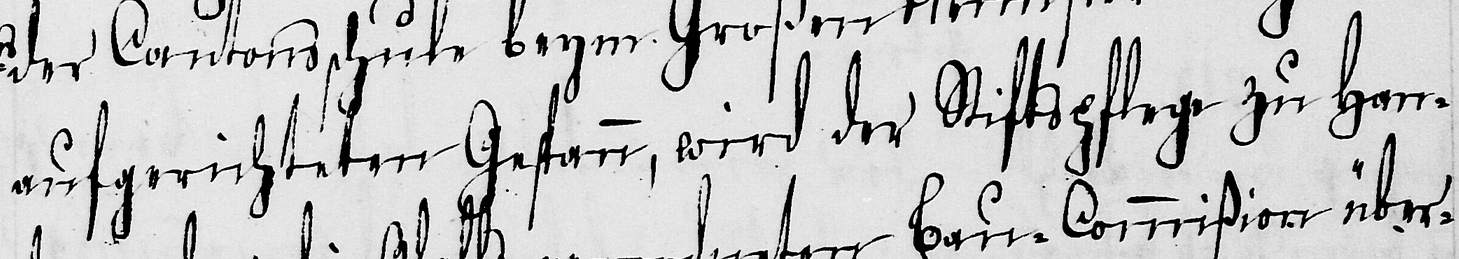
aufgerichteten Gespann, wird der Stiftspflege zu Han¬
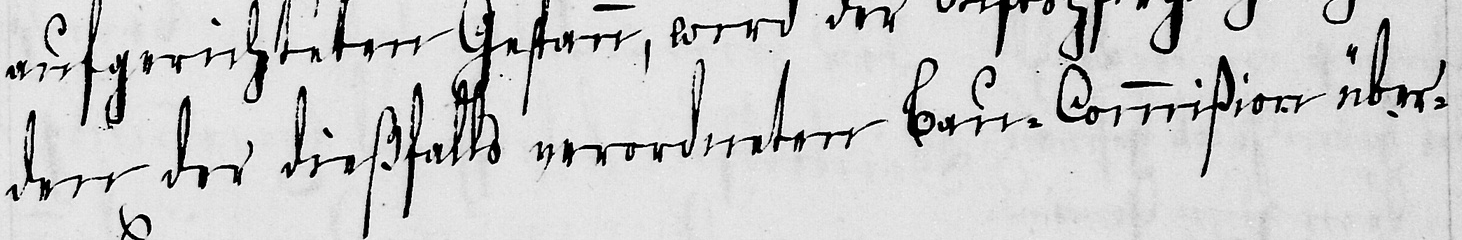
den der dießfalls verordneten Bau-Commißion über¬
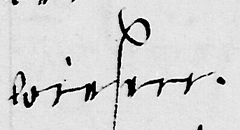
wiesen.
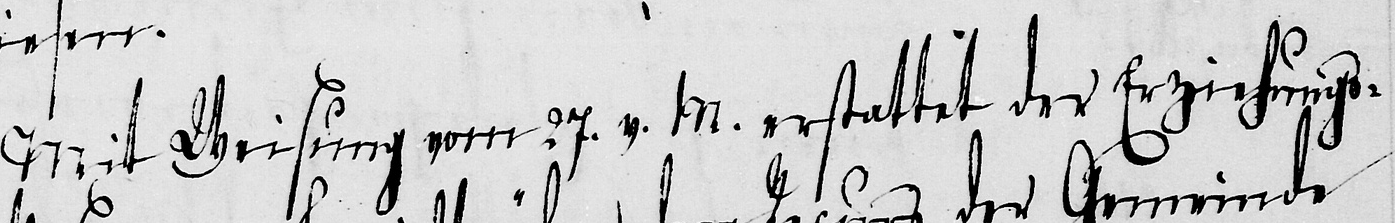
Mit Weisung vom 27. v. M. erstattet der Erziehungs¬
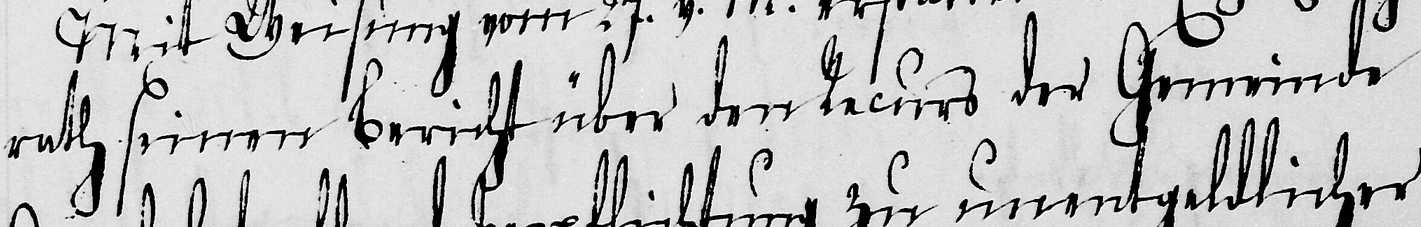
rath seinen Bericht über den Recurs der Gemeinde
